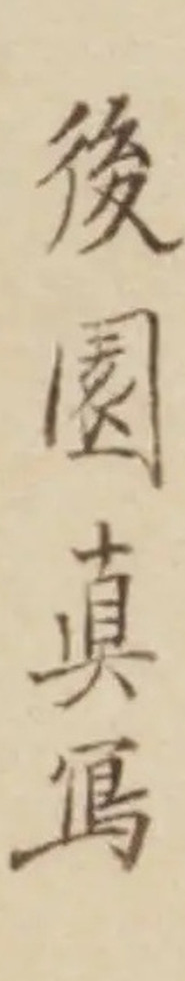後園真寫

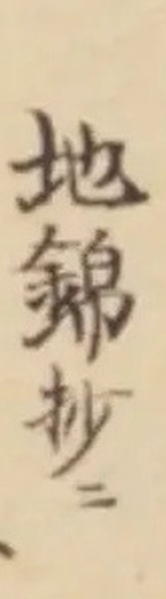地錦抄に
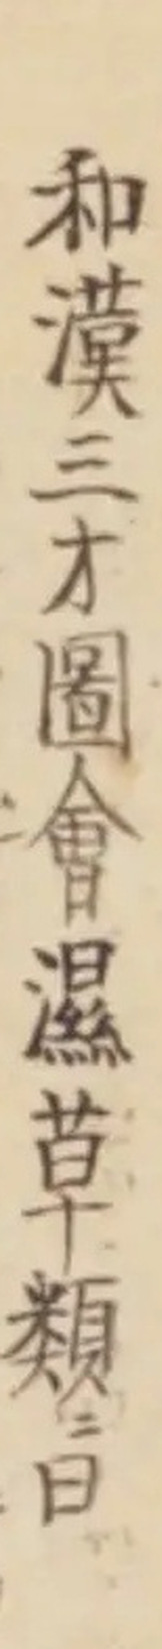和漢三才圖會濕草類ニ曰
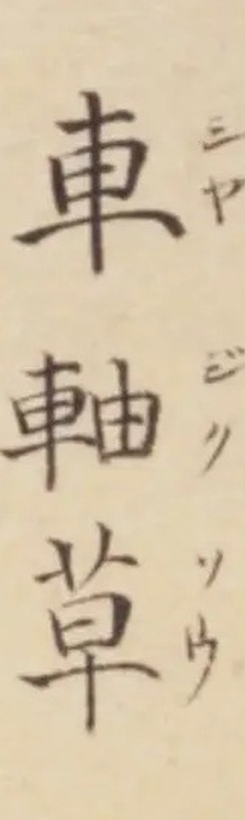車軸草
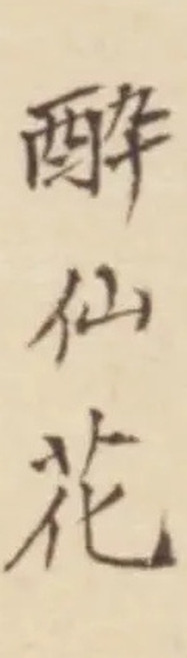酔仙花
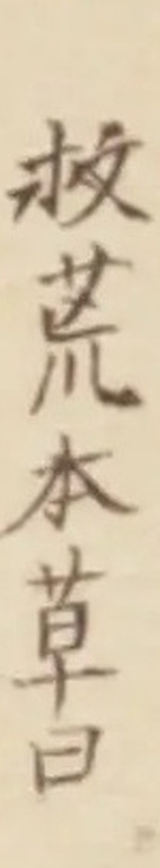救荒本草曰
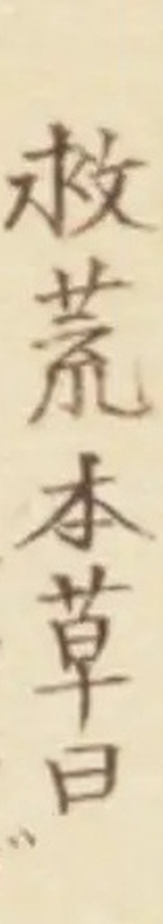救荒本草曰
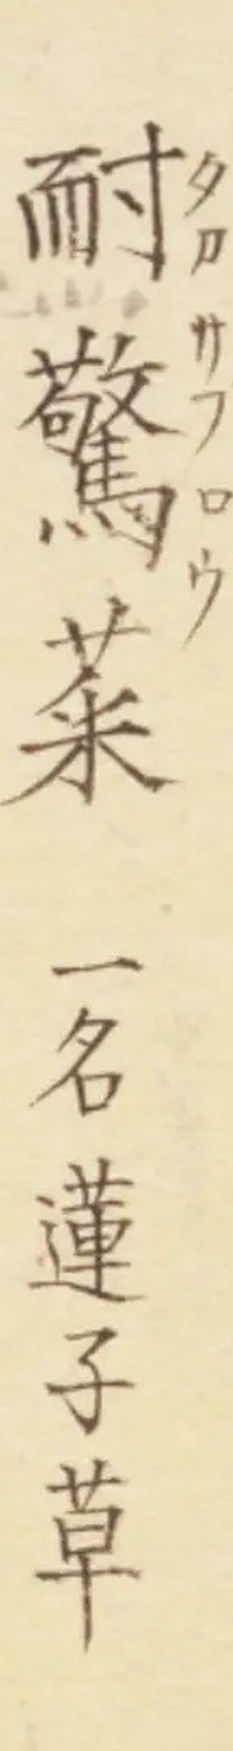耐驚菜一名蓮子草
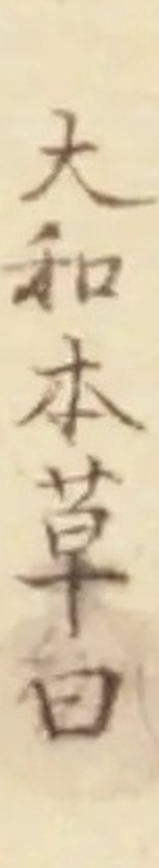大和本草曰
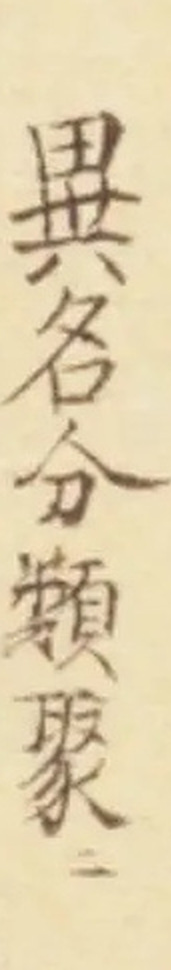異名分類抄
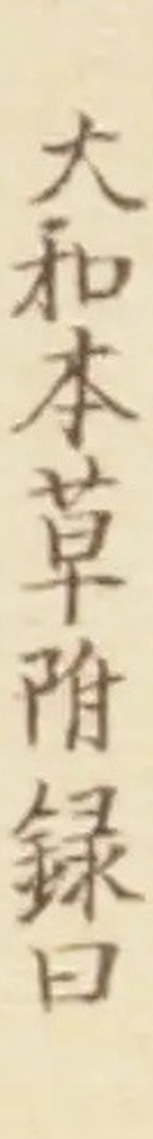大和本草附録曰
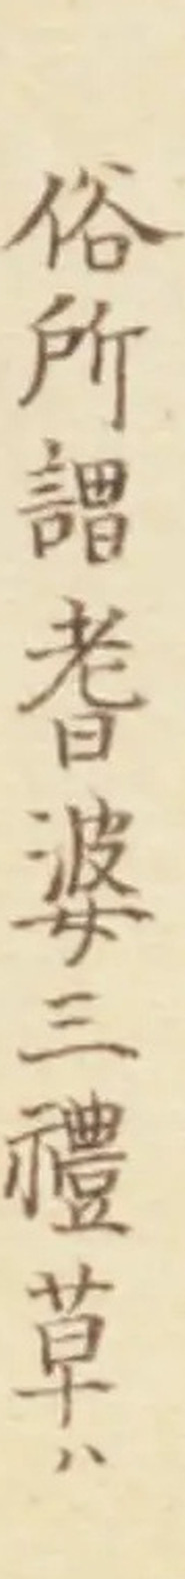俗所謂耆婆三禮草は
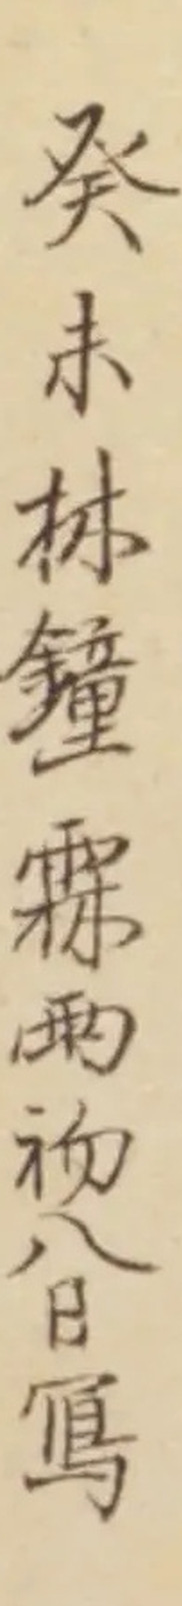癸未林鐘霖両初八日寫

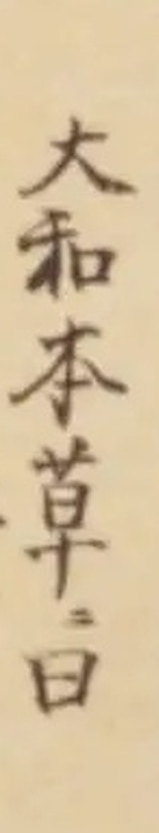大和本草曰
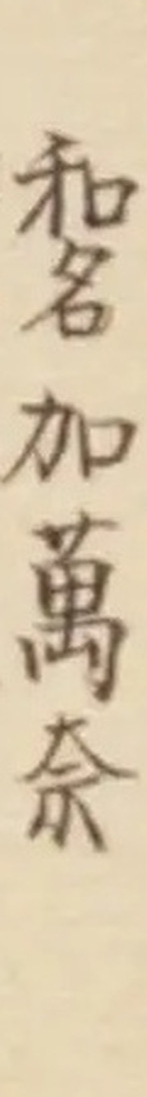和名加萬奈
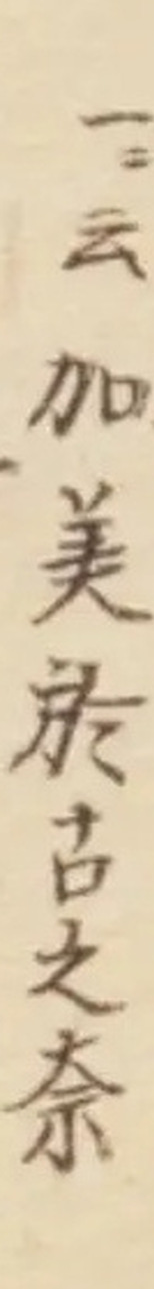一に云か加美於古之奈
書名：梅園草木花譜夏之部. 2
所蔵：国立国会図書館 National Diet Library, JAPAN
